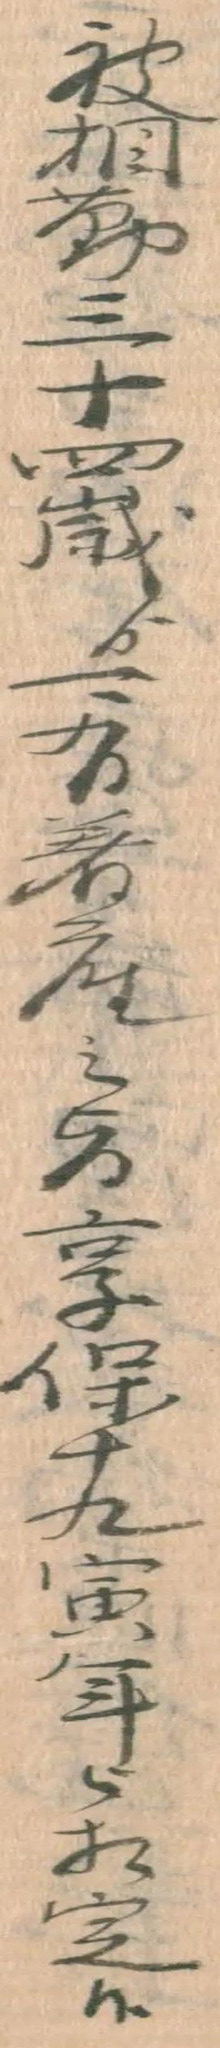被相勤三十四歳ゟ可有着座之旨享保十九寅年被相定候
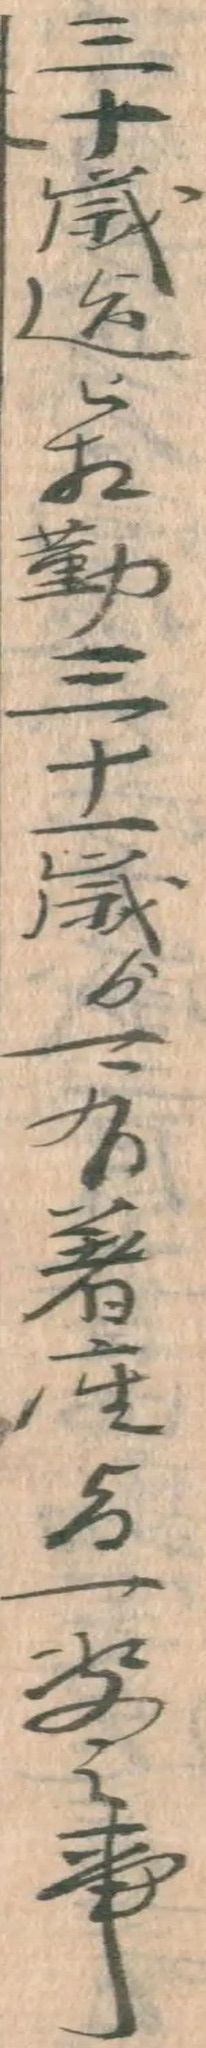三十歳迄被相勤三十一歳ゟ可有着座旨一決之事
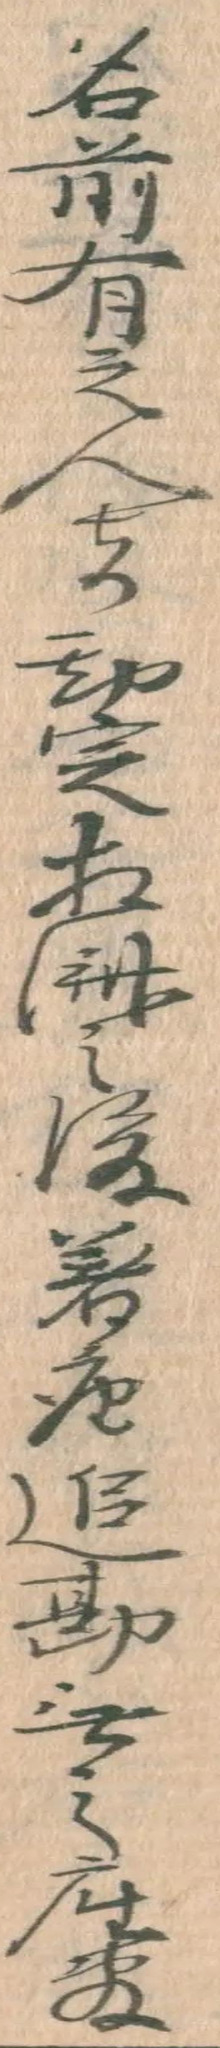名前有之人は勘定相済之後着座追勘無之座敷
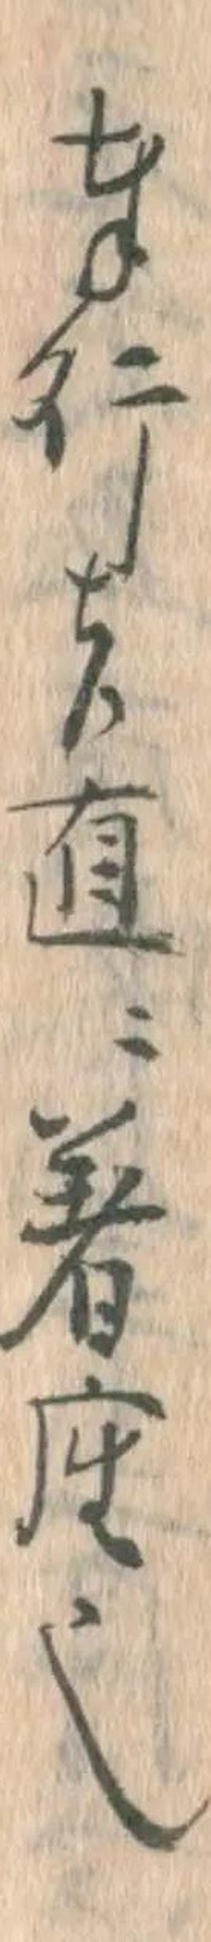奉行者直ニ着座也
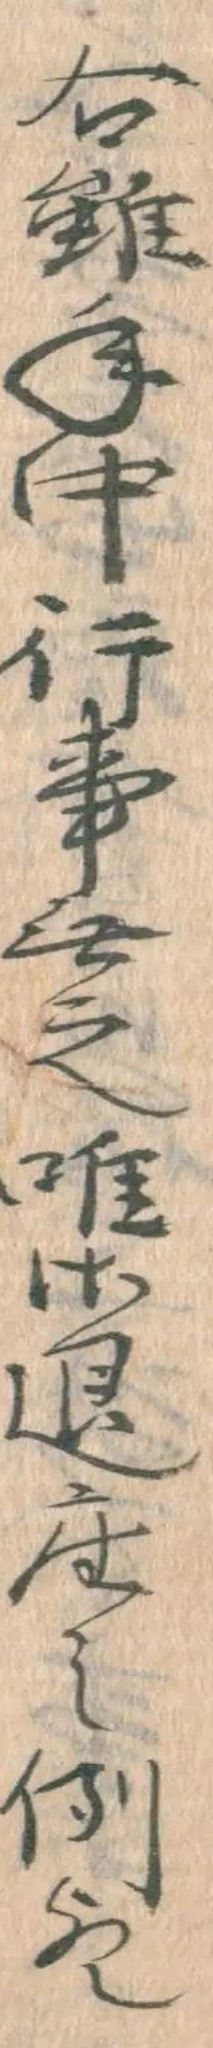右昨雖年中行事無之唯御退座之例歟
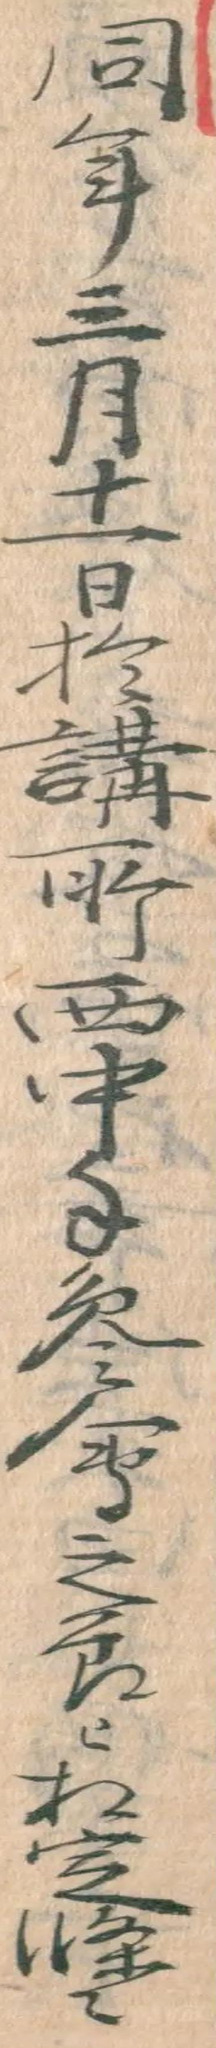同年三月十一日於講所西中手参會之節被相定條々
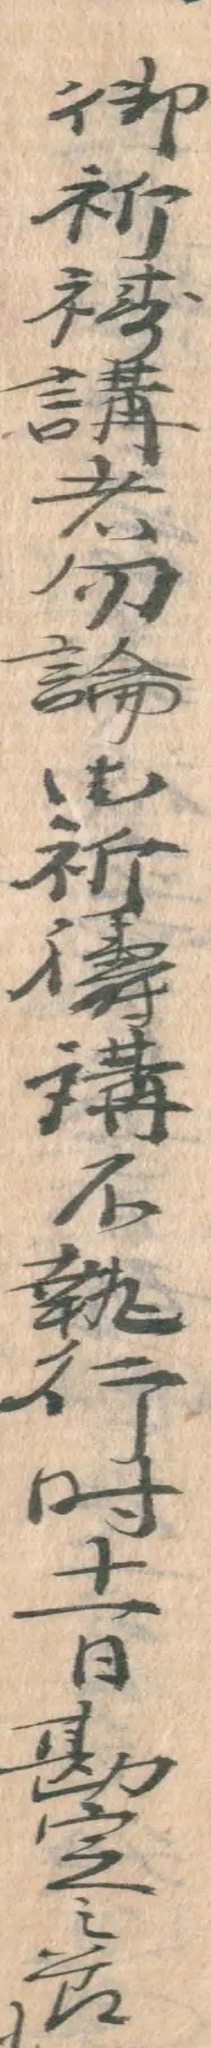一御祈禱講者勿論御祈祷講不執行時十一日勘定之節
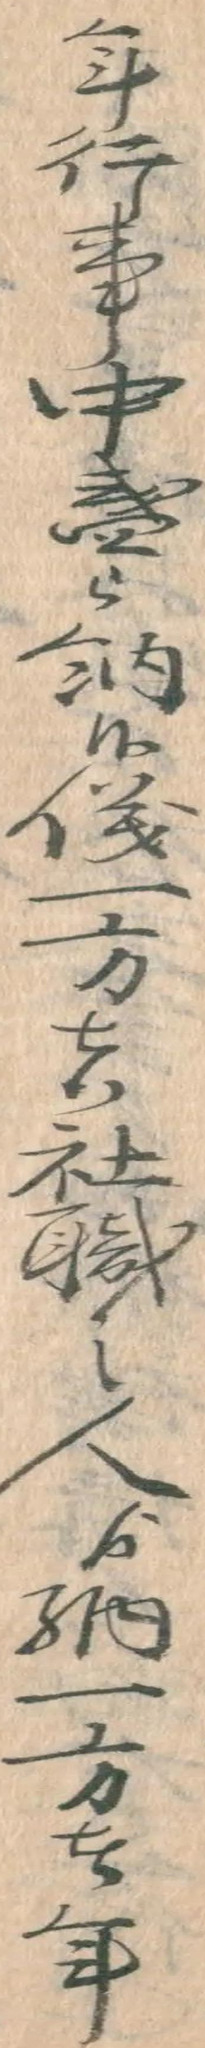年行事中盞被納候儀一方は社職之人ゟ納一方は年
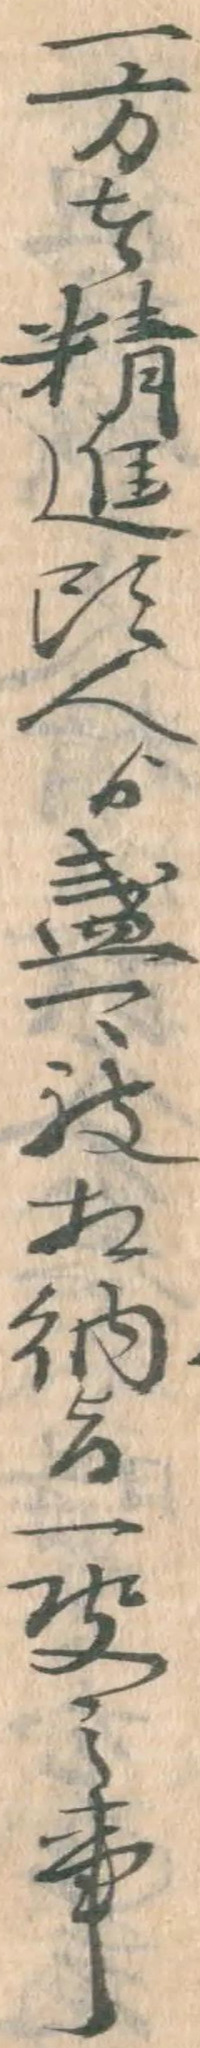一方は精進頭人ゟ盛可被相納旨一決之事
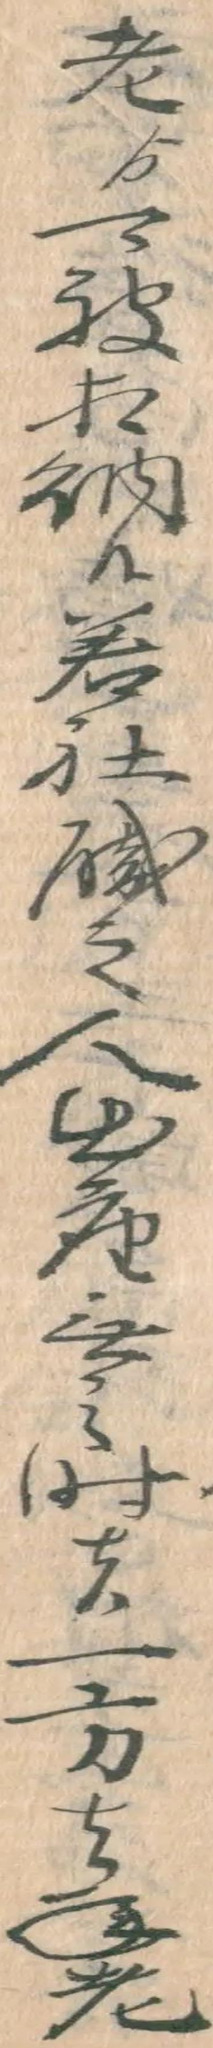老ゟ可被相納候若社職之人出座無之時は一方は年老

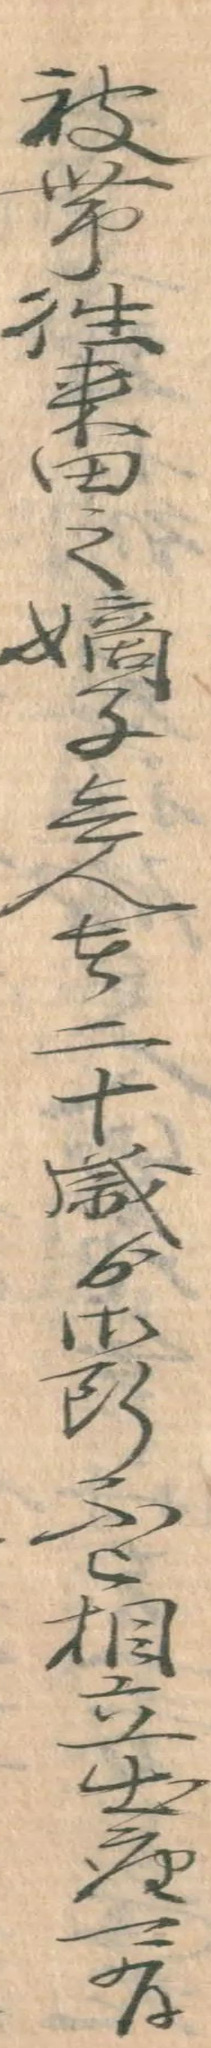一被帯往来田之嫡子壱人は二十歳ゟ御断不被相立出座可有
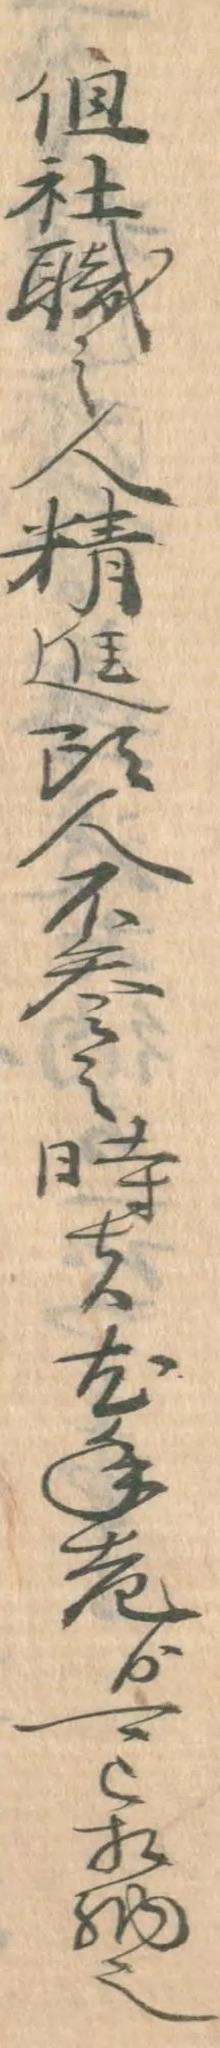但社職之人精進頭人不参之時は尤年老ゟ可被相納也
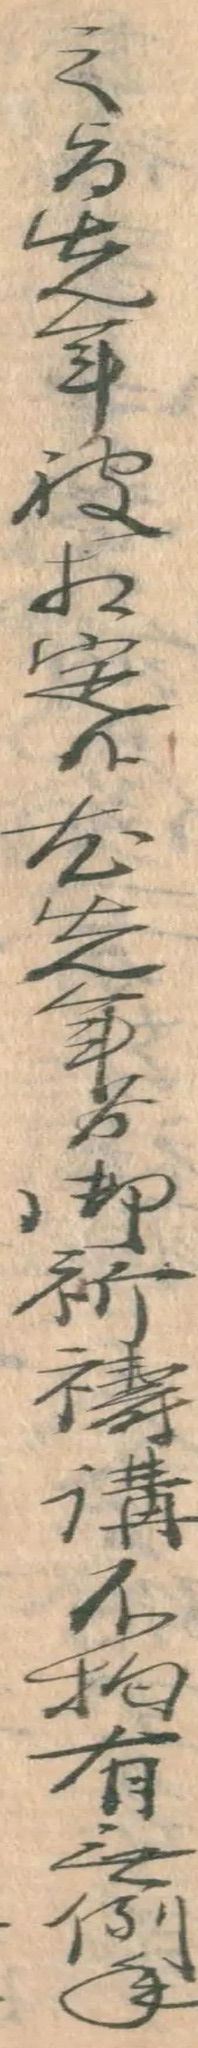之旨先年被相定候尤先年ゟ御祈祷講不拘有無例年
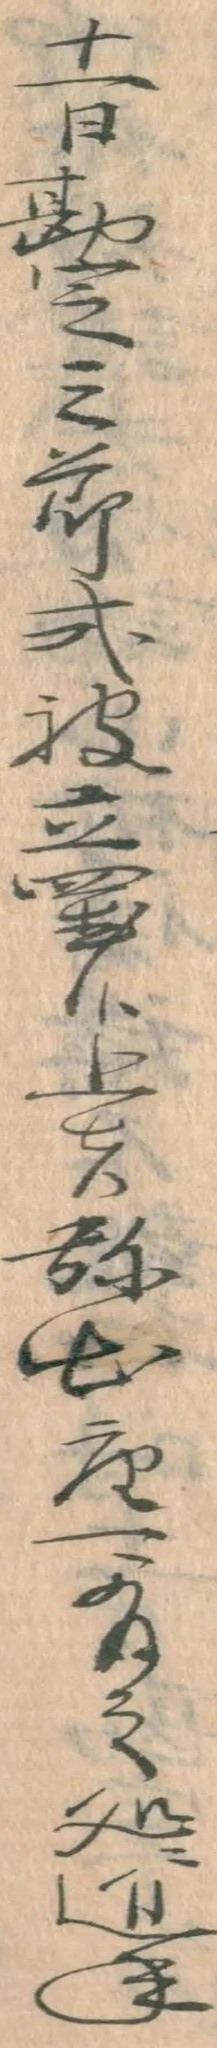十一日勘定之節式被立置候上は弥出座可有之処ニ近年
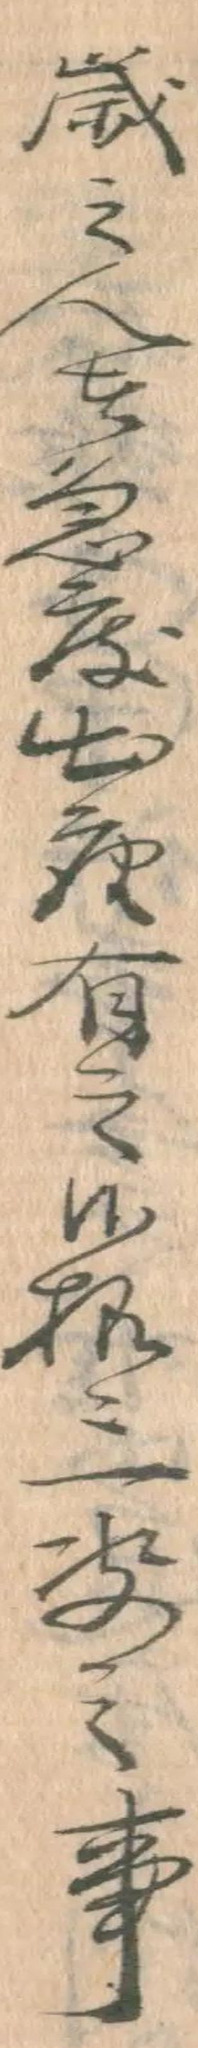歳之人は急度出座有之候様に一決之事
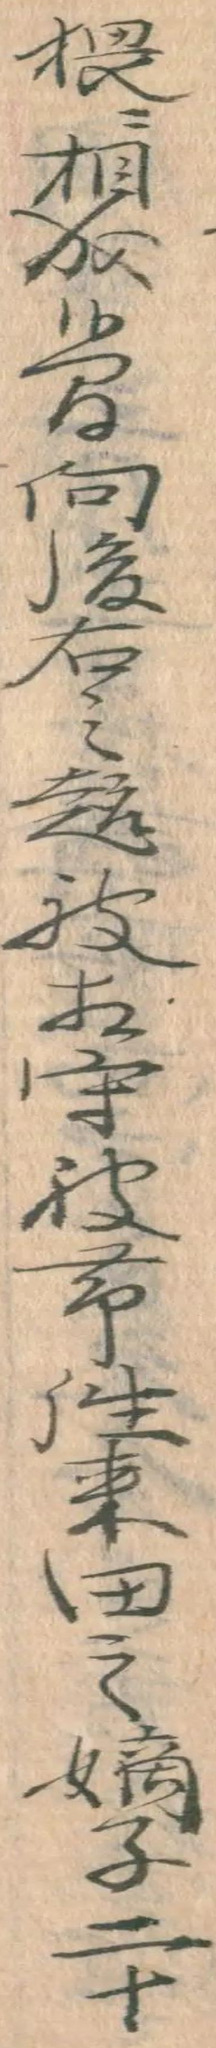猥ニ相成候間向後右之趣被相守被帯往来田之嫡子二十
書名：賀茂社記録. 第29冊
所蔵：国立国会図書館 National Diet Library, JAPAN
